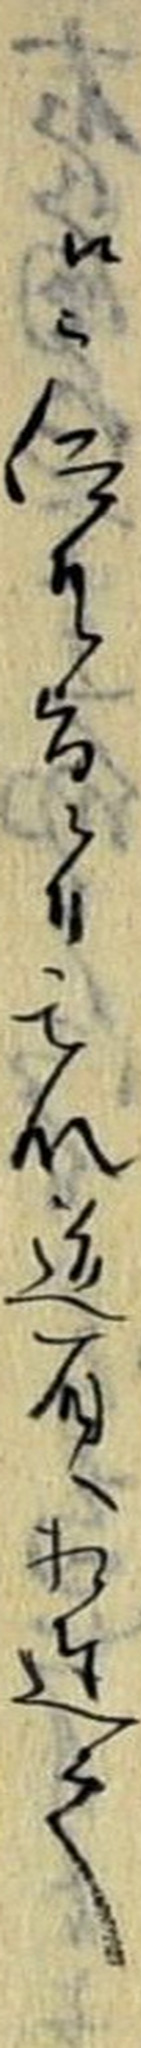江被仰付候旨に付其段道有へ相達之
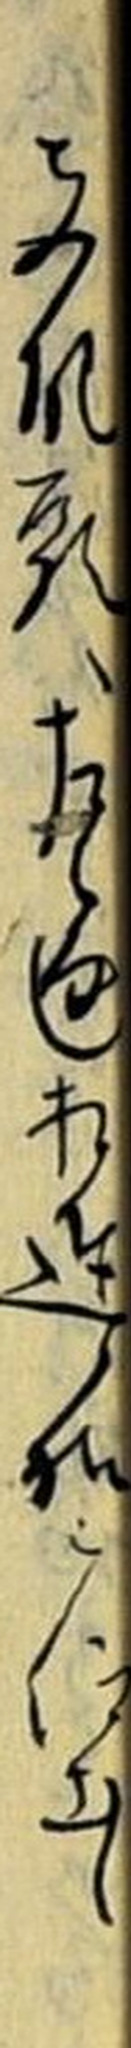支配頭へ左之通相達候様被仰出之
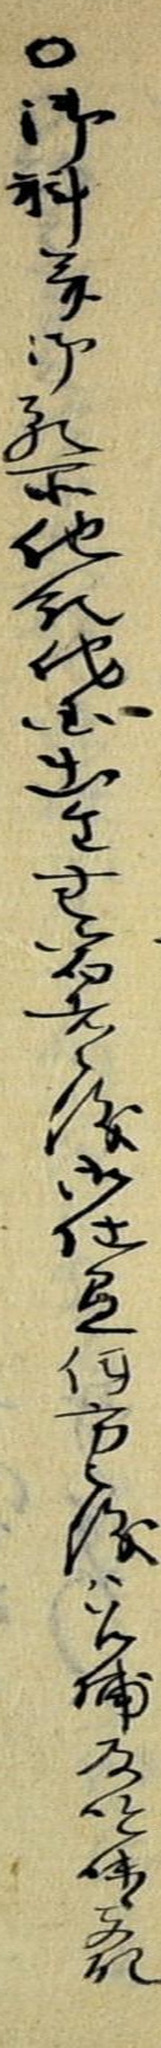○御料并御預所他領他国出生無宿者之儀御仕置伺方之儀は召捕及吟味候支配
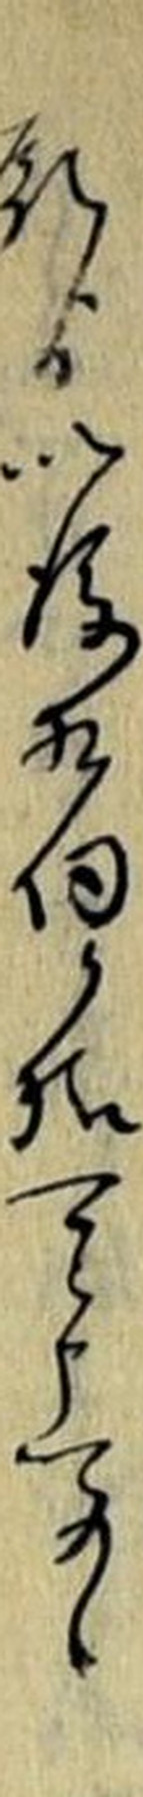領ゟ以後相伺候様可被申聞候
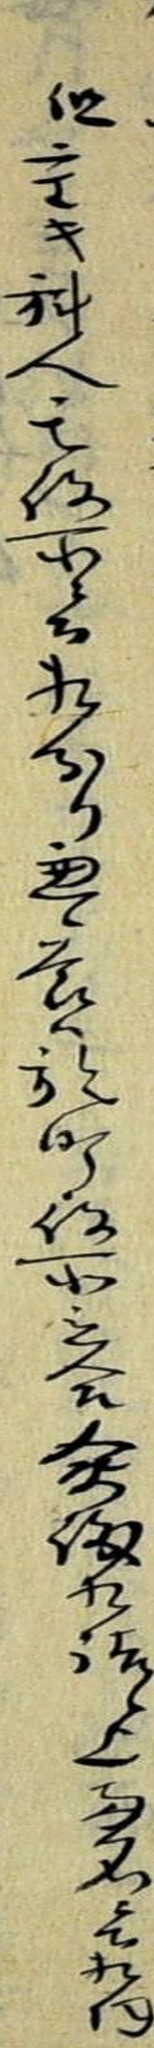但重キ科人其役所に而相分り兼候節は於町役所立合僉儀相詰候上両名に而相伺
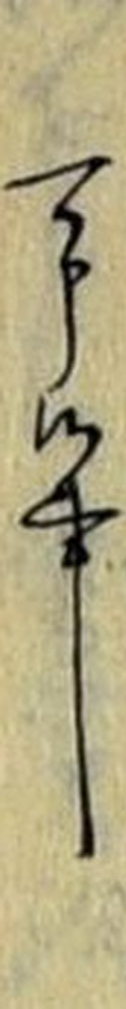可申候事
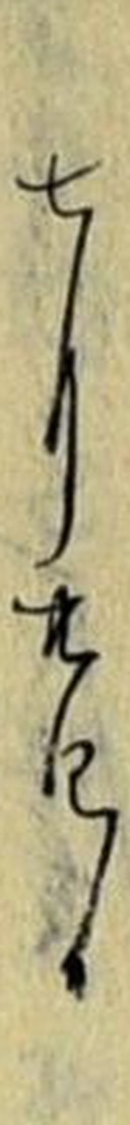七月廿四日
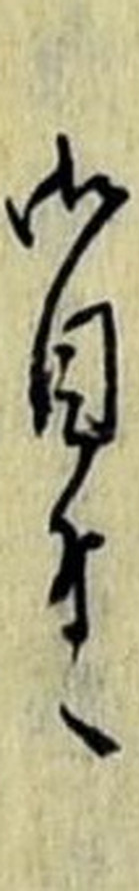御目付へ
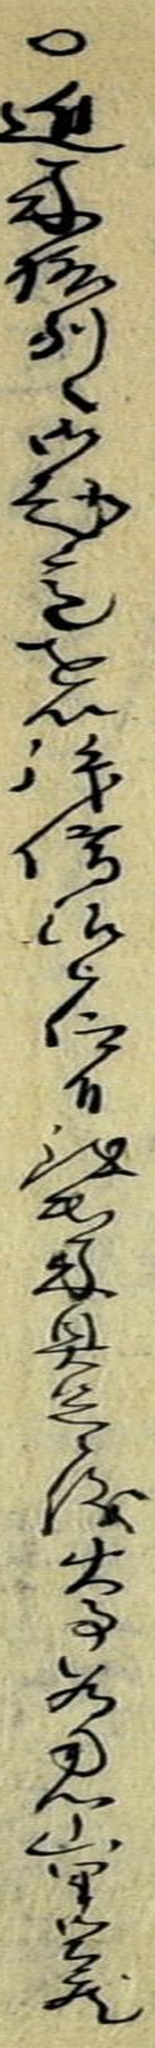○近来格別之御趣意を以拝借銀被仰付致出来具足之儀火事為用心山里御土蔵
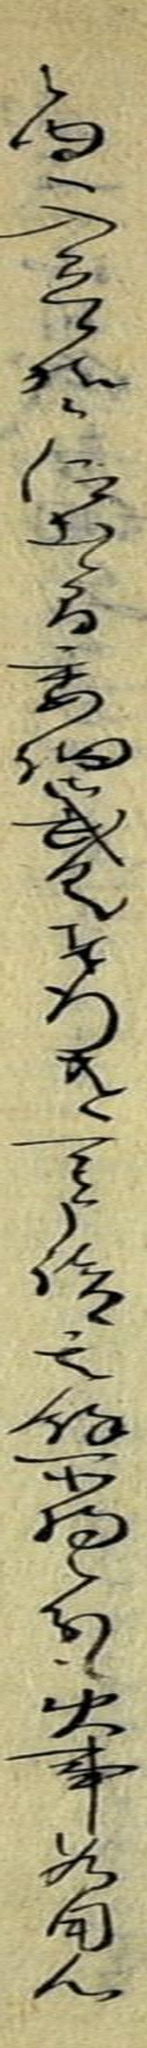之内へ入置候様被仰出候間委細御武具奉行共へ可被申談候其餘所持之分も火事為用心
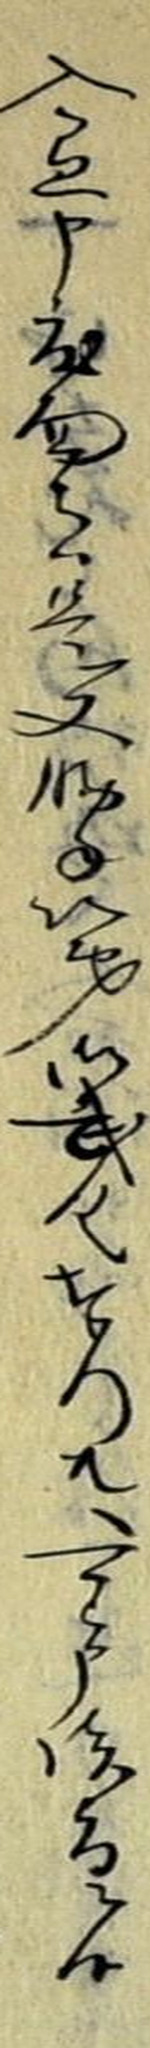入置申度面々は是又勝手次第御武具奉行共へ可被申談旨に候
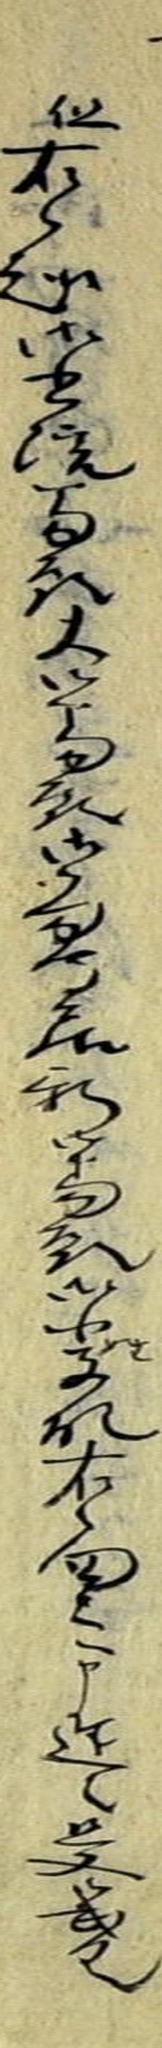但右之趣御書院番頭大御番頭御留守居新御番頭御小姓支配右之面々へ申達之且又御武具
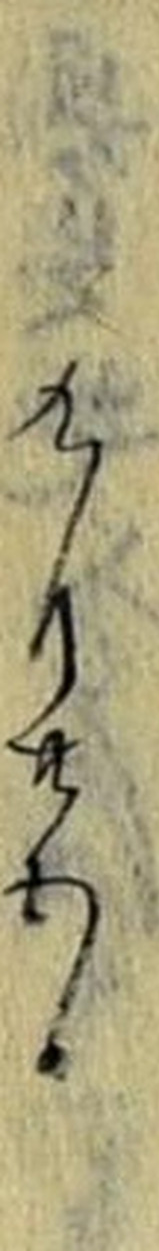九月廿五日
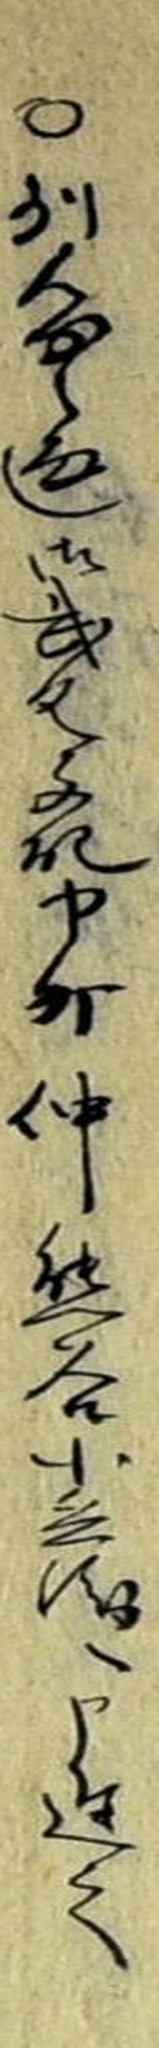○別紙之通御武具支配中村仲熊谷小兵衛へ申達之

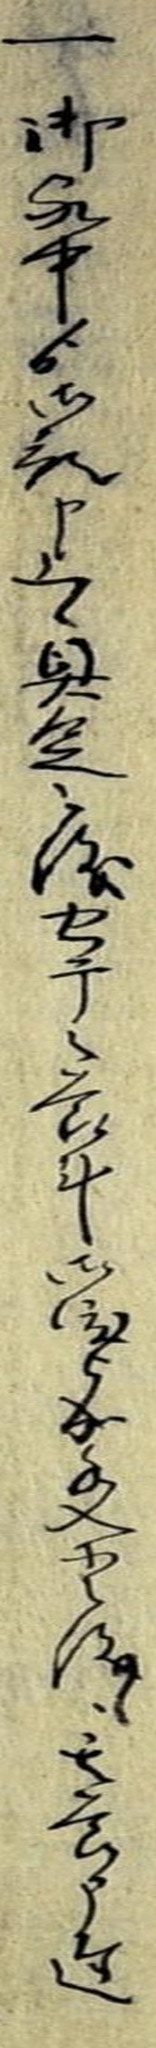一御家中ゟ御預申上候具足之儀虫干之節斗御渡成手入等之儀も其節申達
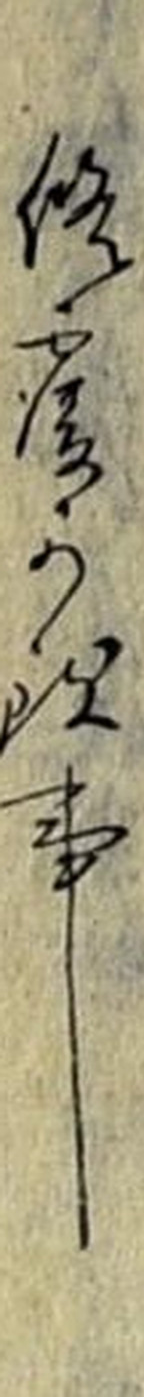修覆可致事
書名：命令之部 四
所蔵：福井県文書館 Fukui Prefectural Archives
